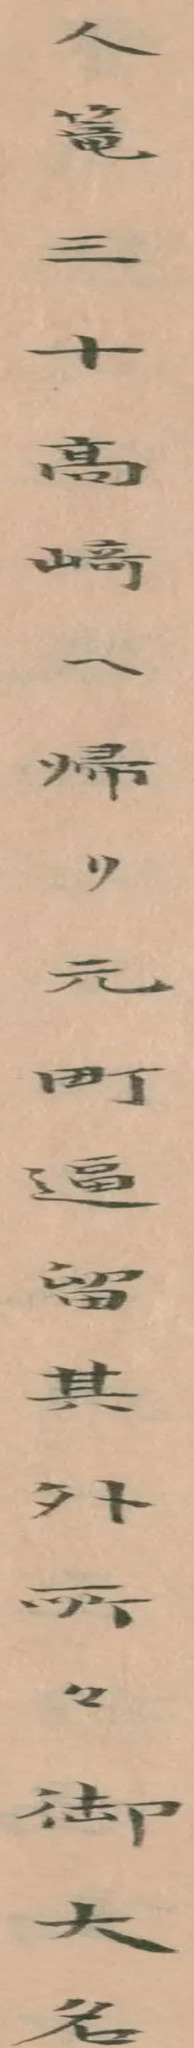人篭三十高崎へ帰り元町逼留其外所々御大名
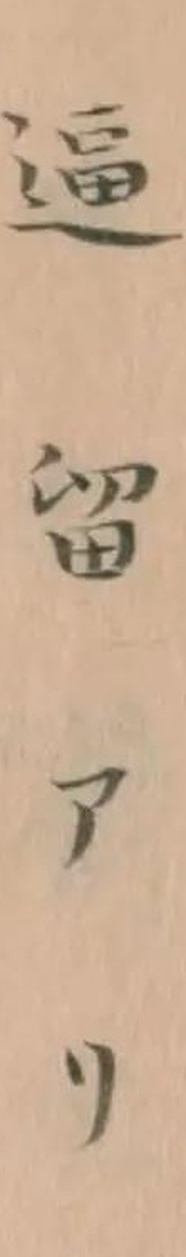逼留アリ
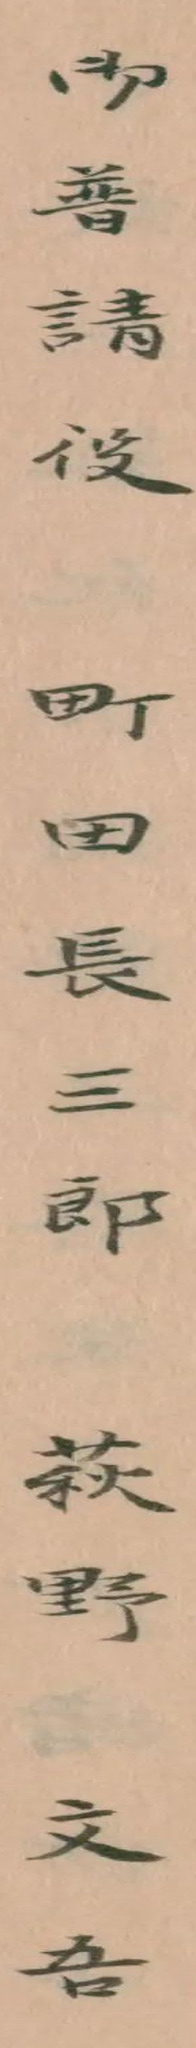御普請役町田長三郎萩野文吾
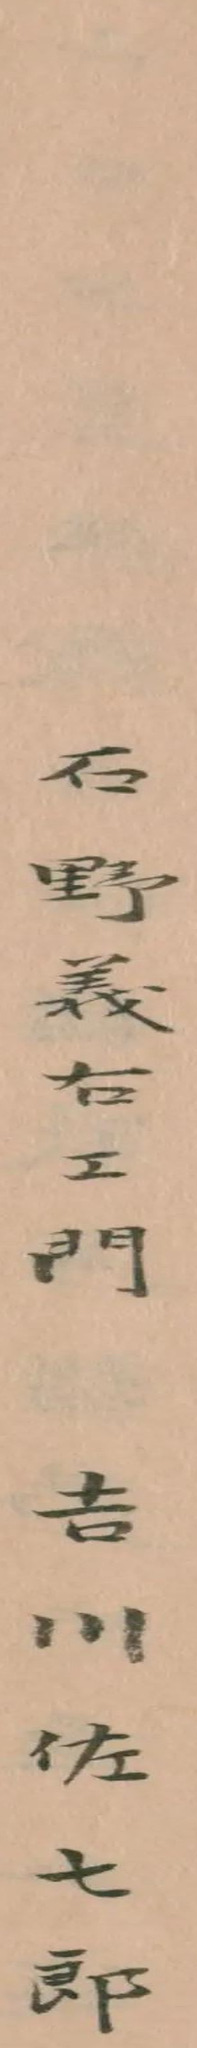石野義右衛門吉川佐七郎
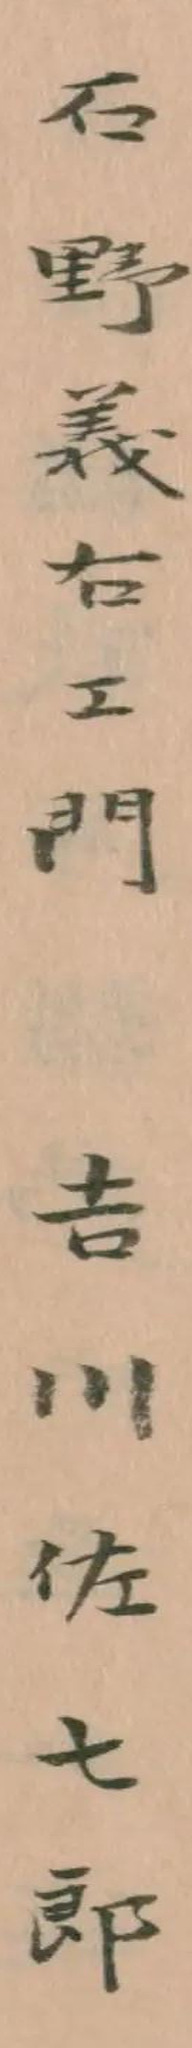石野義右衛門吉川佐七郎
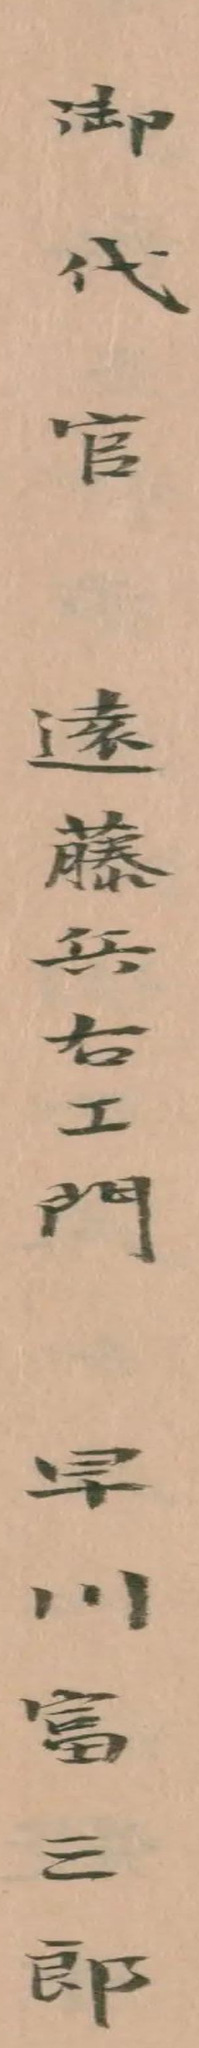御代官遠藤兵右衛門早川富三郎
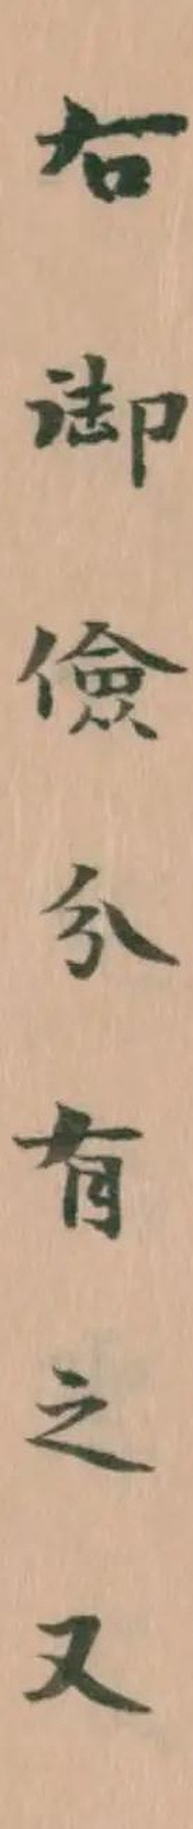右御倹分有之又
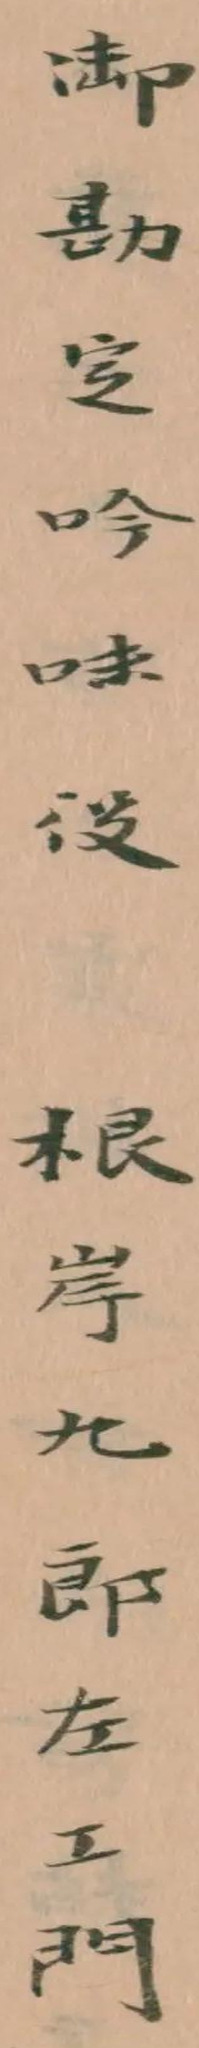御勘定吟味役根岸九郎左衛門
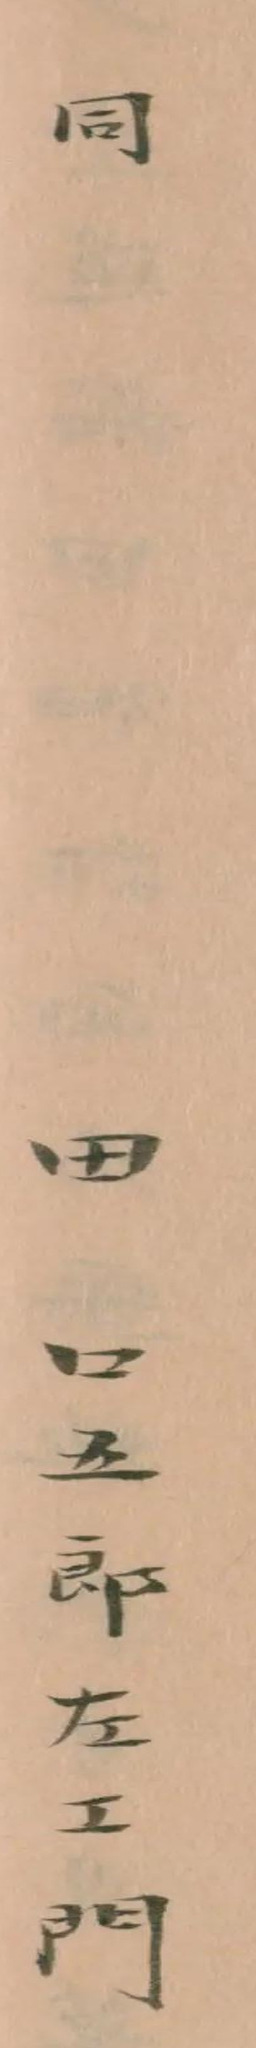田口五郎左衛門
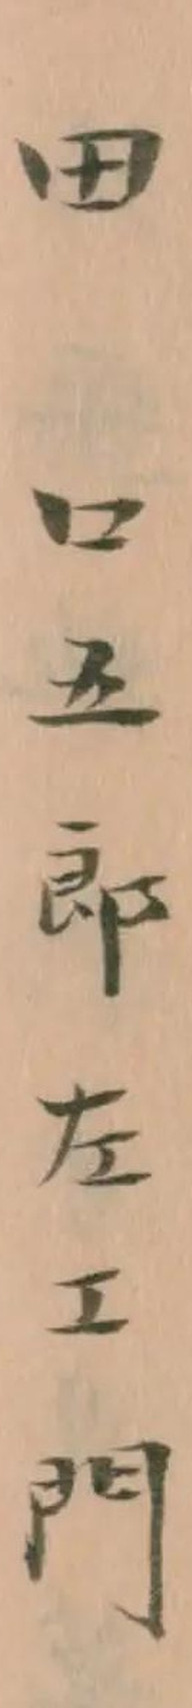田口五郎左衛門
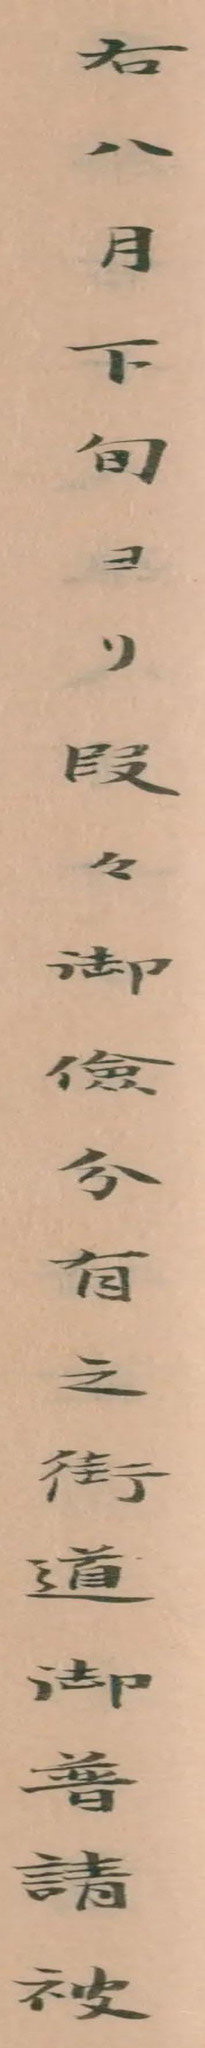右八月下旬ヨリ段々御倹分有之街道御普請被
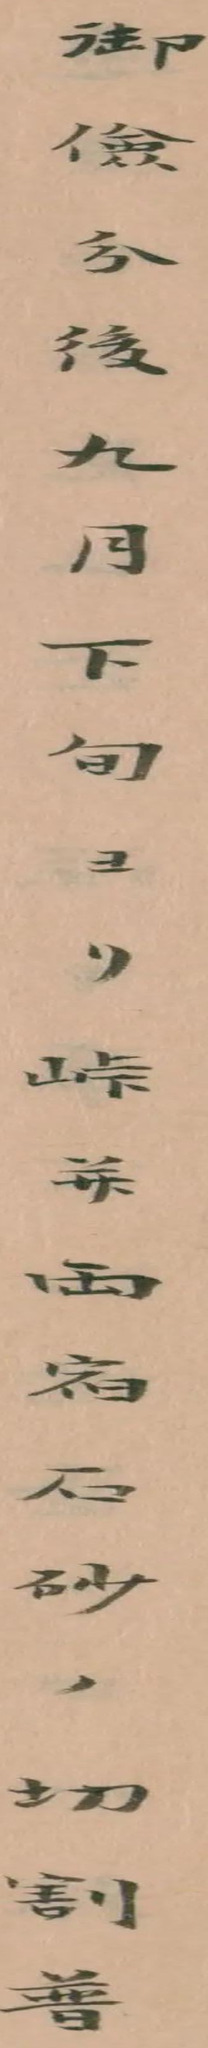御倹分後九月下旬ヨリ峠并両宿石砂ノ切割普
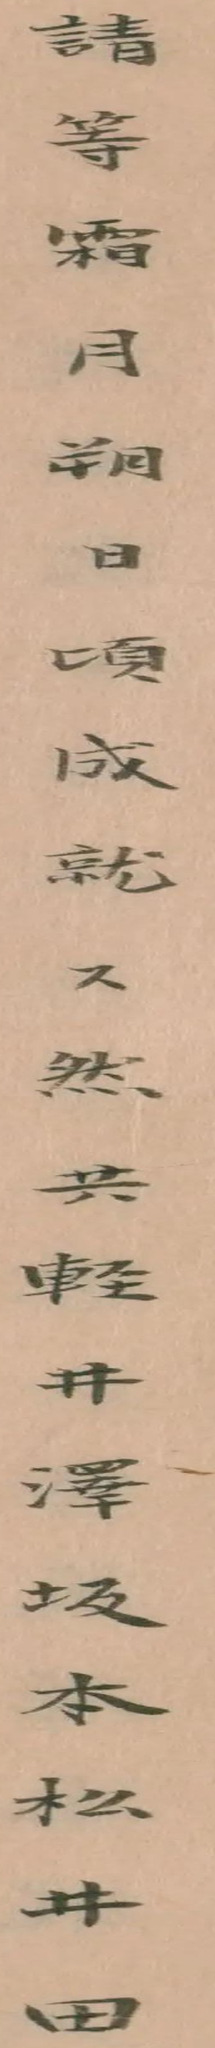請等霜月朔日頃成就ス然共軽井沢坂本松井田
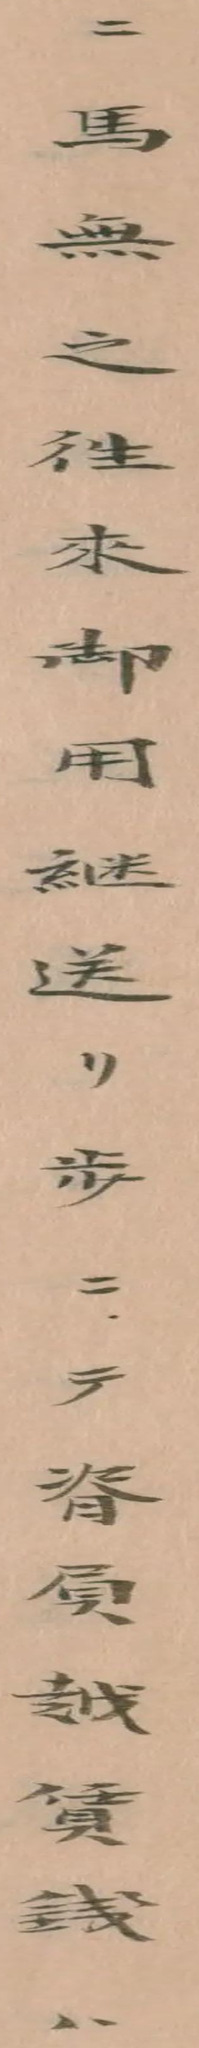二馬無之往来御用継送り歩ニテ背負越賃銭ハ
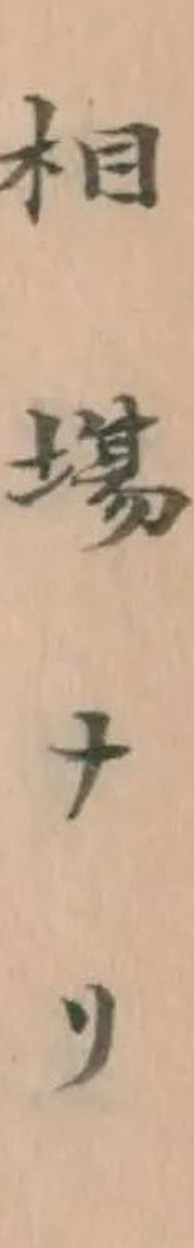相場ナリ
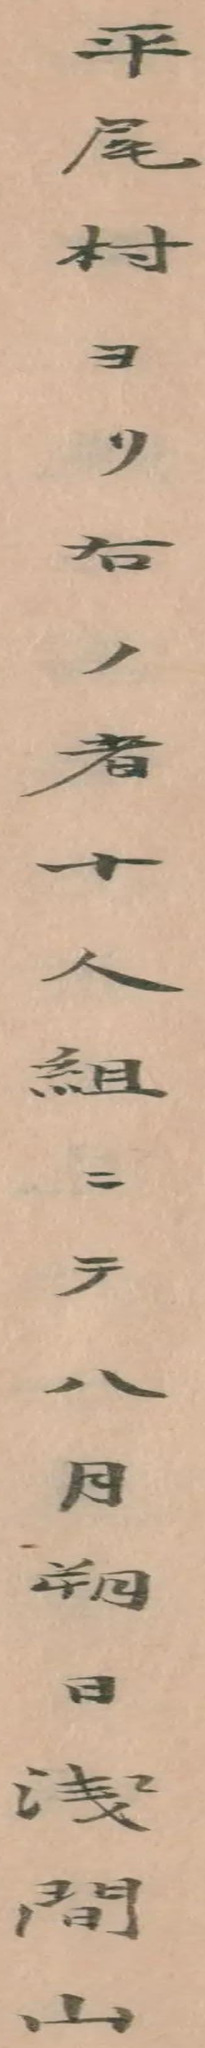平尾村ヨリ右ノ者十人組ニテ八月朔日浅間山
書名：地災撮要. 巻3(地震之部)-巻4(噴火之部)
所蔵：国立国会図書館 National Diet Library, JAPAN
